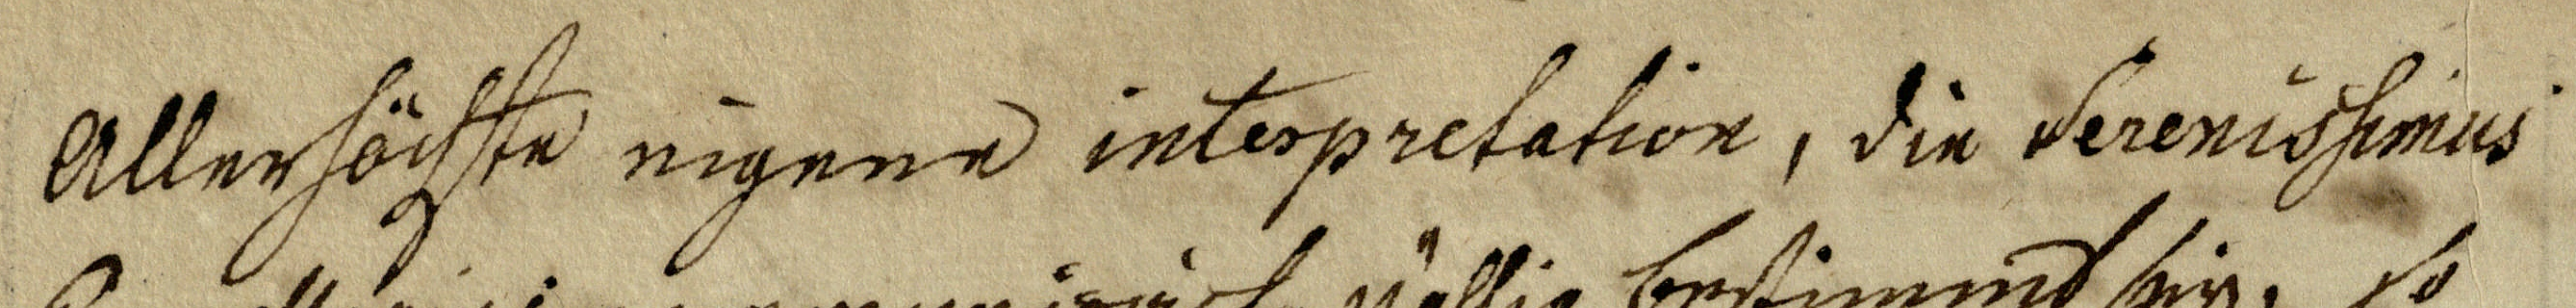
Allerhöchste eigene interpretation, die Serenissimus
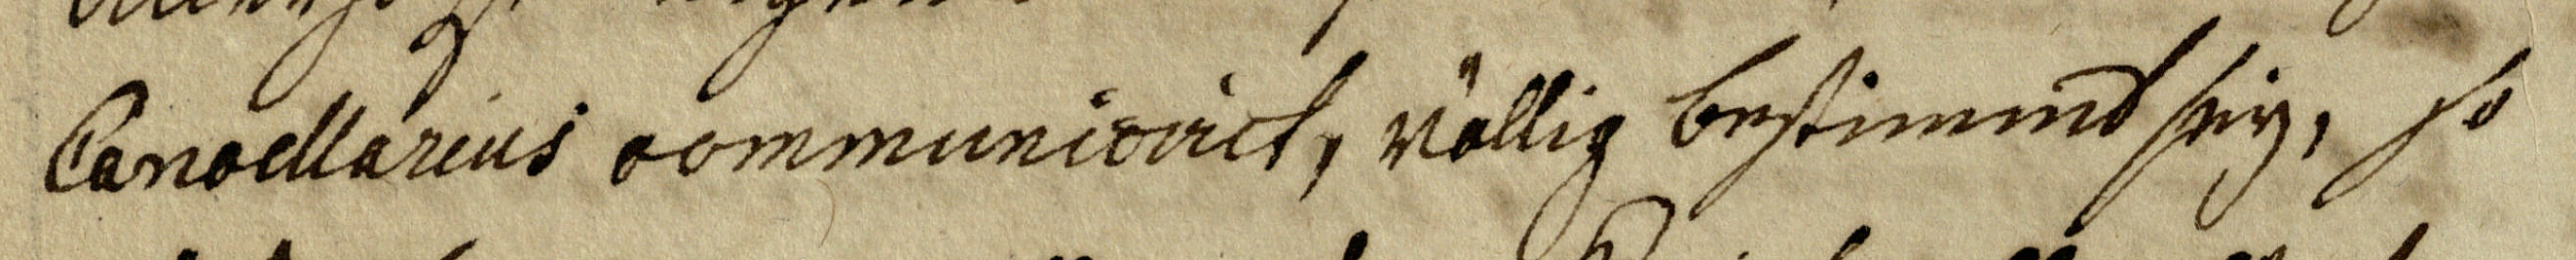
Cancellarius communiciret, völlig bestimmt seÿ, so
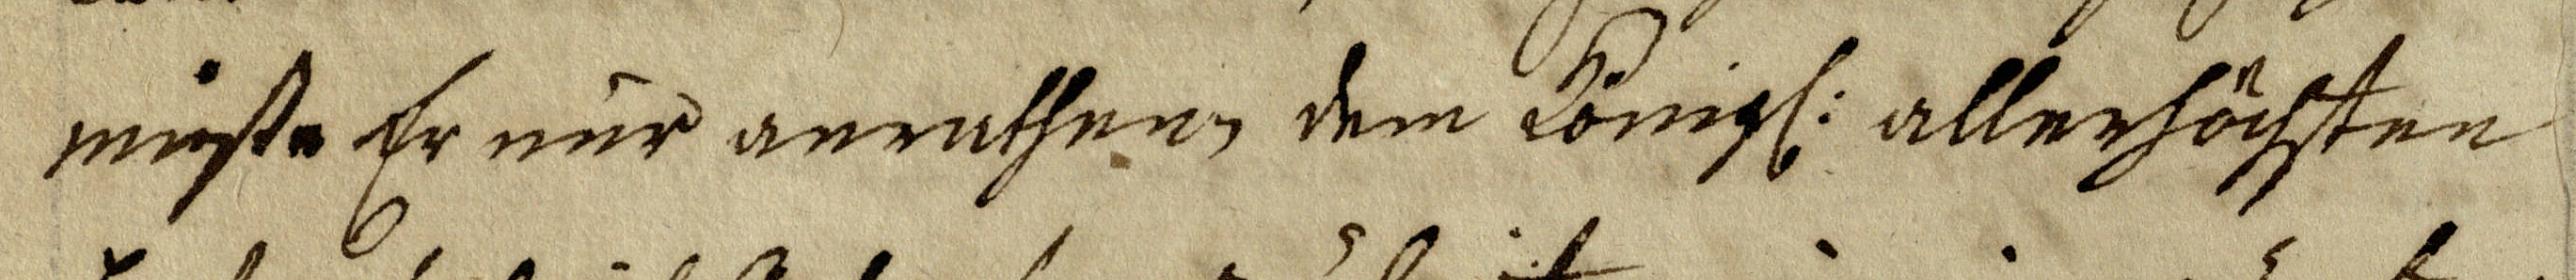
müßte Er nur anrathen, dem Königl. allerhöchsten
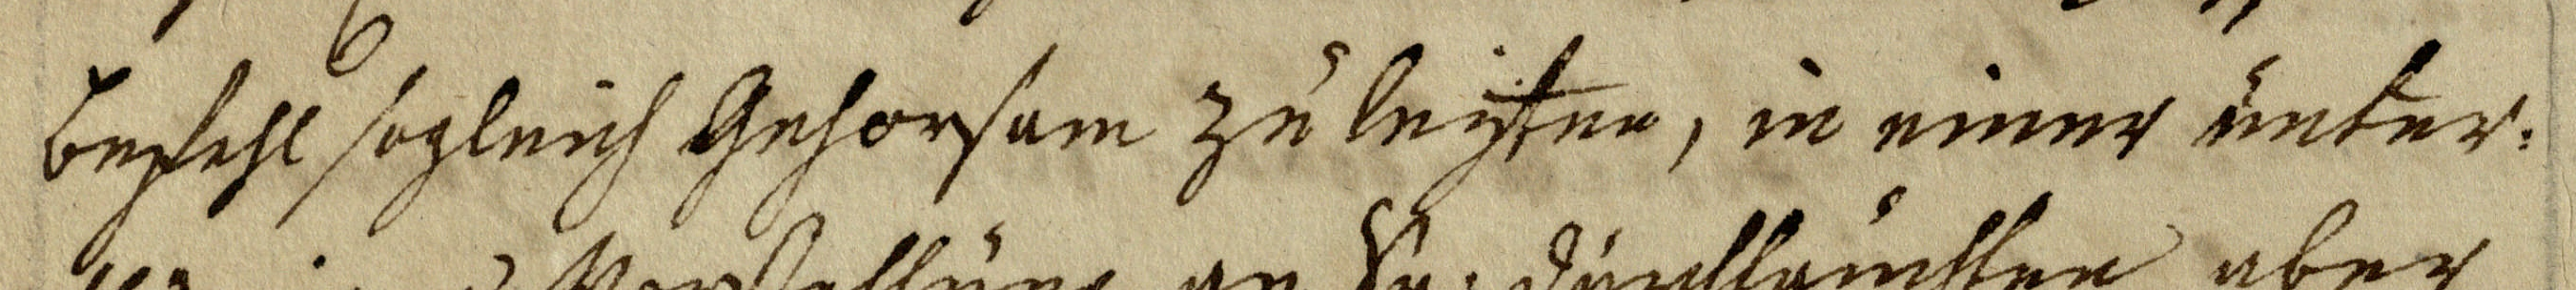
Befehl sogleich Gehorsam zu leisten, in einer unter¬
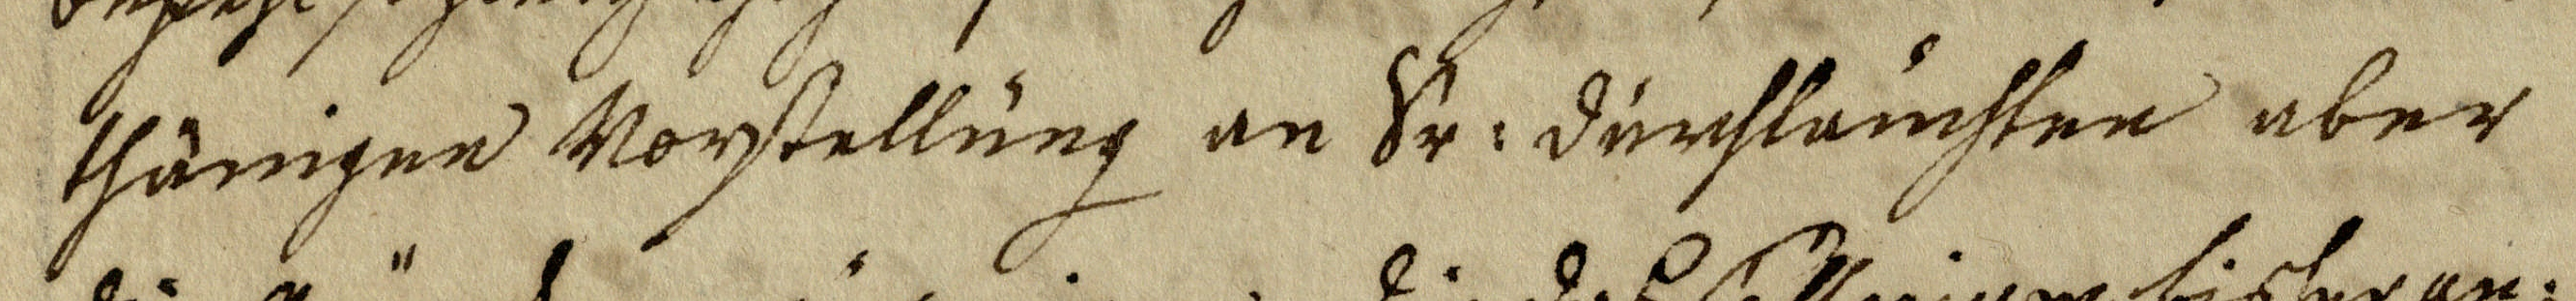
thänigen Vorstellung an Sr. Durchlauchten aber
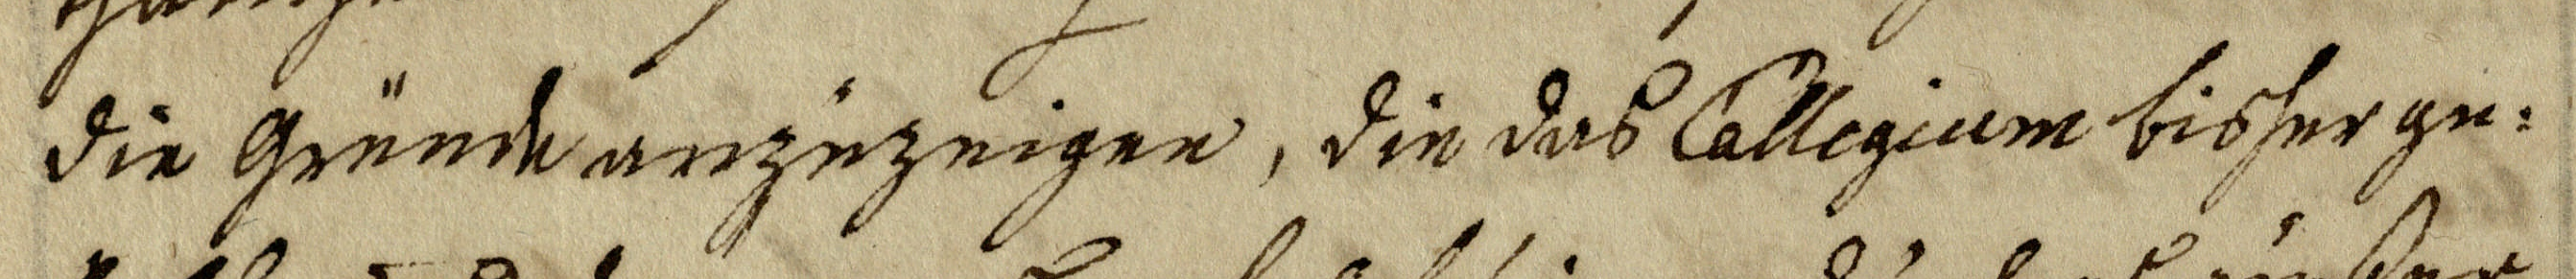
die Gründe anzuzeigen, die das Collegium bisher ge¬
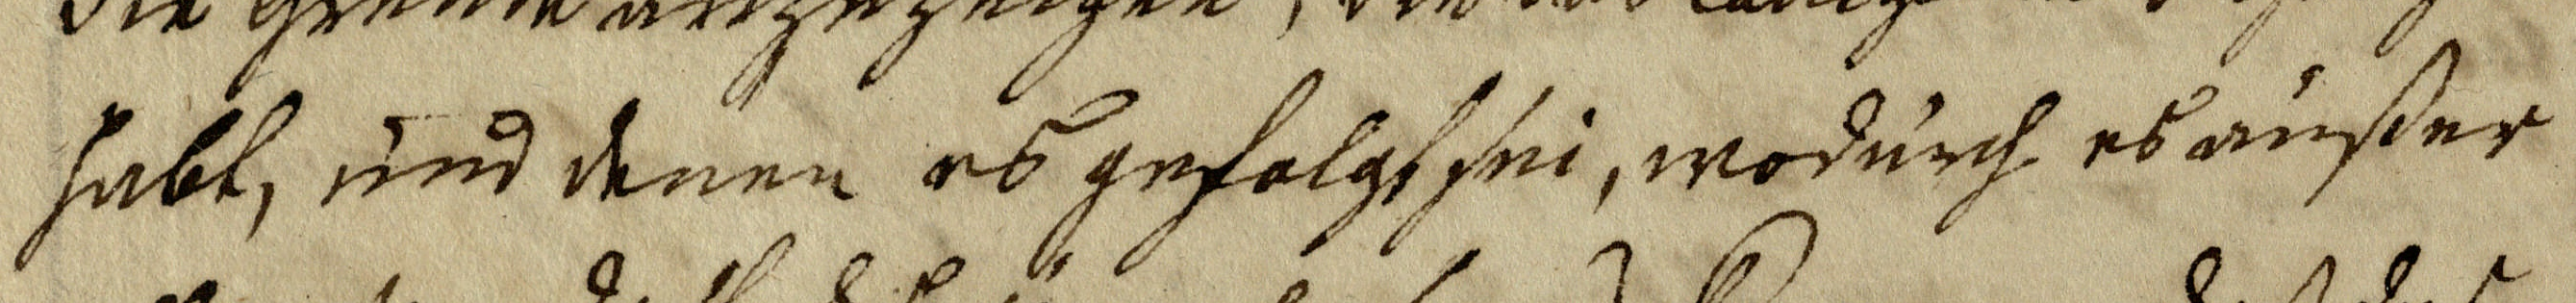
habt, und denen es gefolgt sei, wodurch es außer
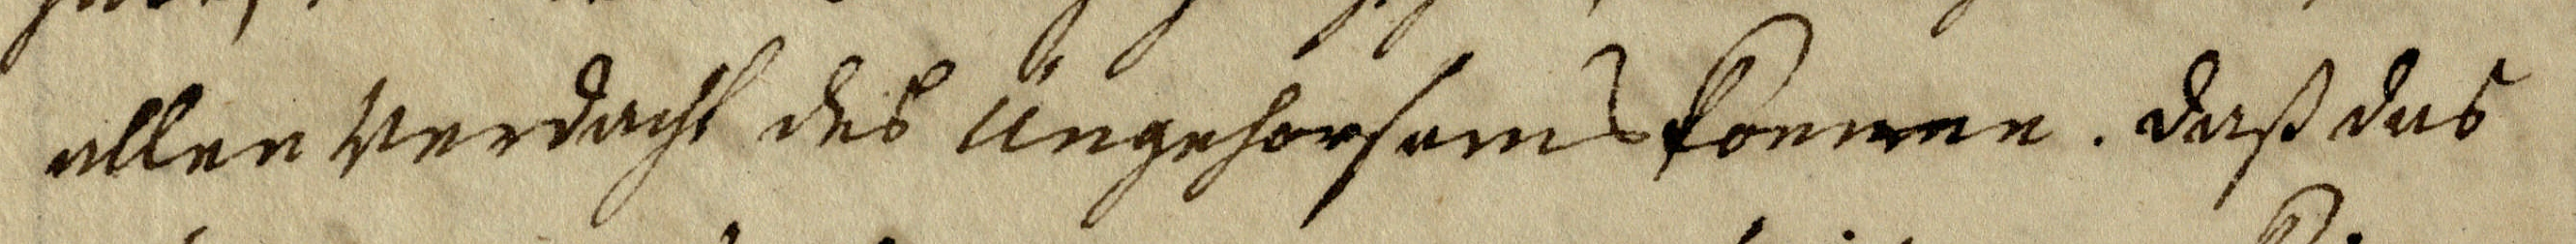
allen Verdacht des Ungehorsams komme. Daß das
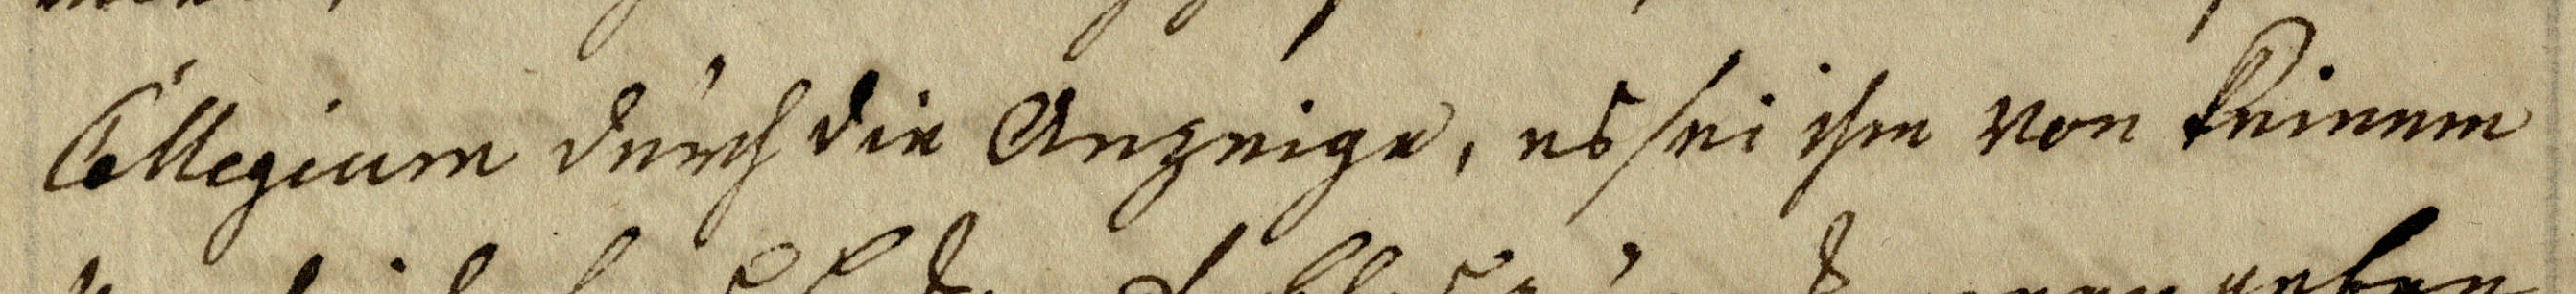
Collegium durch die Anzeige, es sei ihm von keinem
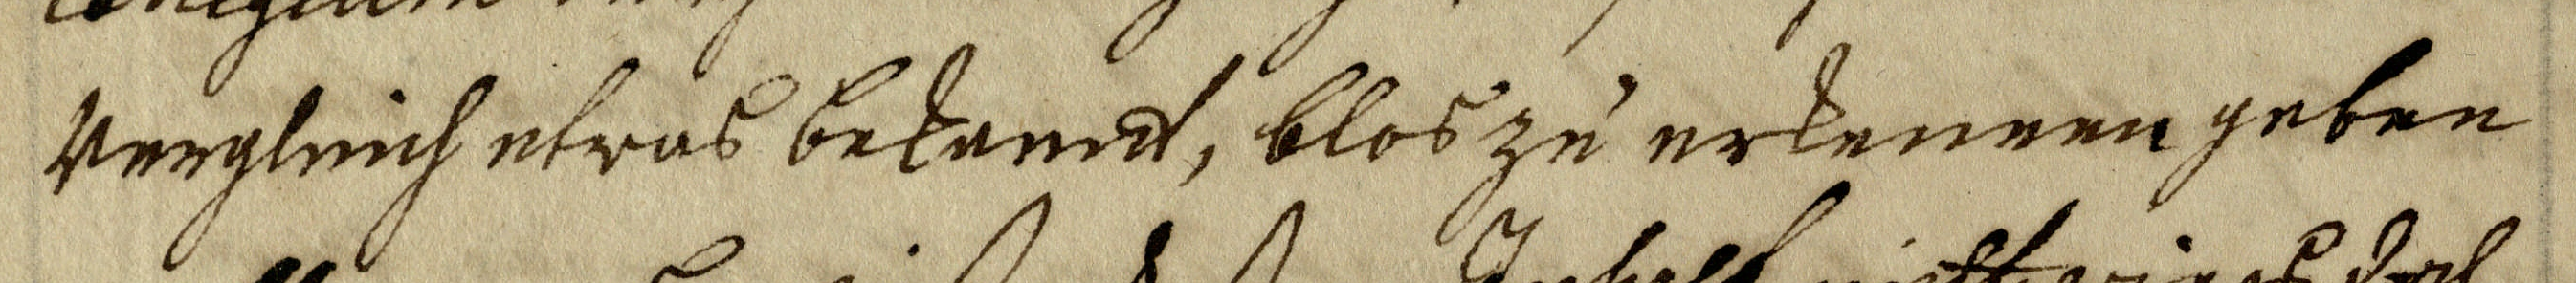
Vergleich etwas bekannt, blos zu erkennen geben
